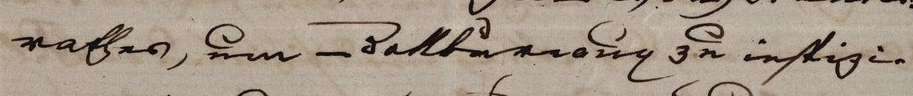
rathes, um Zollbureaux zu inspizi-
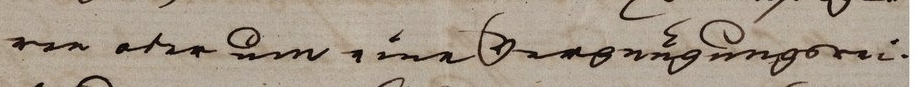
ren oder um eine Vergnügungsrei-
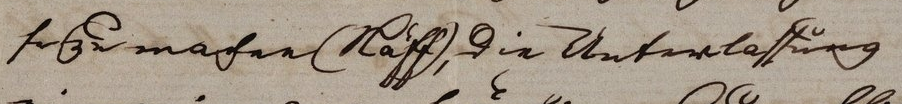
se zu machen (Näff), die Unterlassung
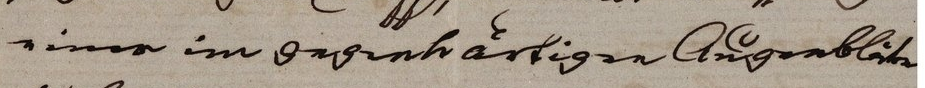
einer im gegenwärtigen Augenblicke
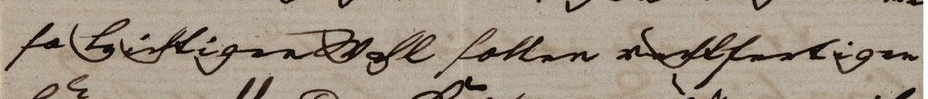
so wichtigen Wahl sollen rechtfertigen
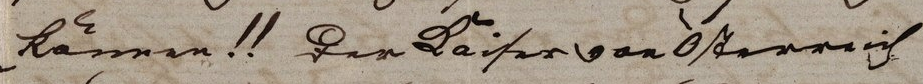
können!! Der Kaiser von Österreich
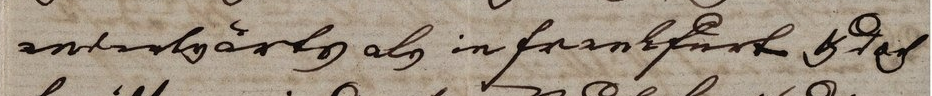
anderwärts als in Frankfurt & doch
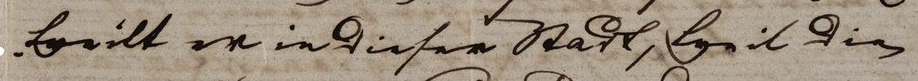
weilt er in dieser Stadt, weil die
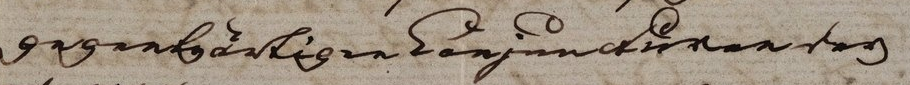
gegenwärtigen Conjuncturen der
